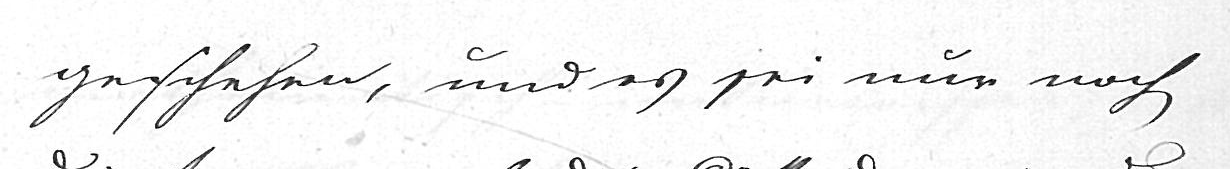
geschehen, und es sein nur noch
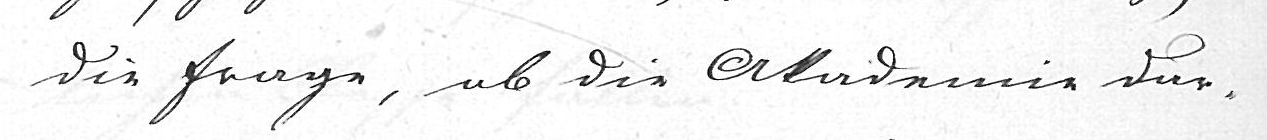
die Frage, ob die Akademie dar-
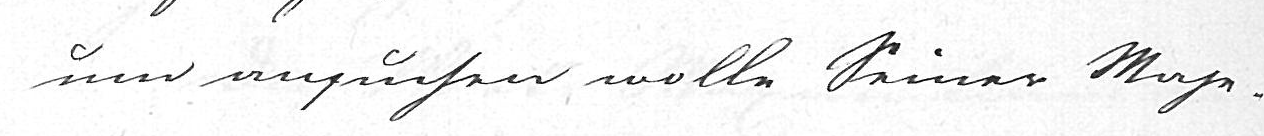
um ansuchen wolle Seiner Maje-
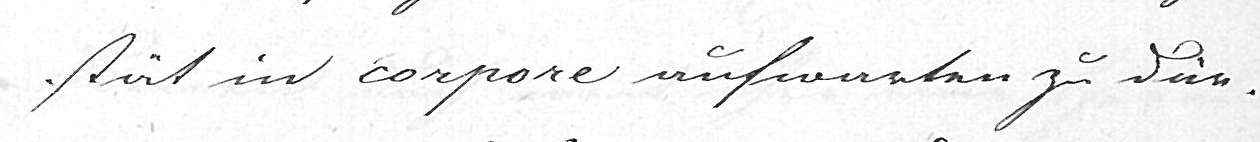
stät in corpore aufwarten zu dür-
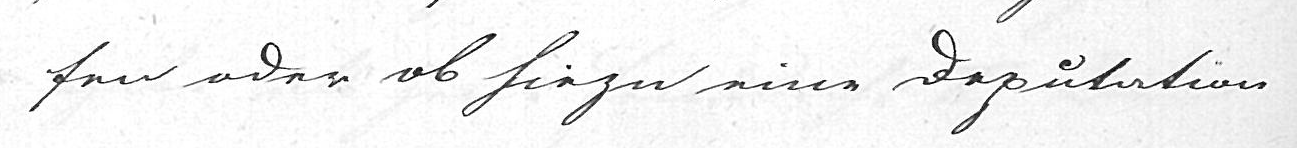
fen oder ob hiezu eine Deputation
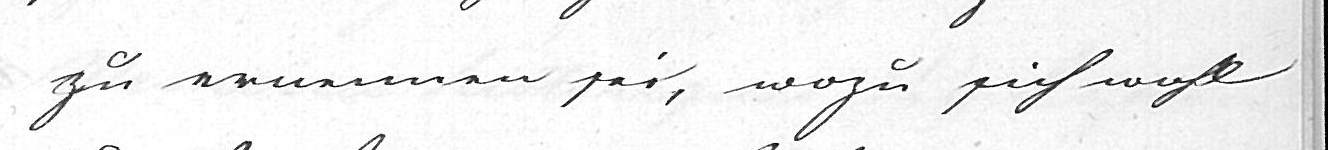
zu ernennen seit, wozu sich wohl
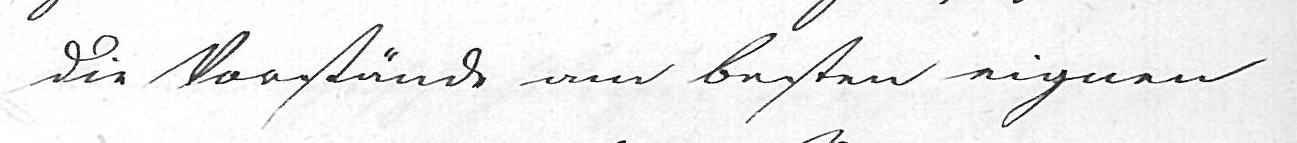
die Vorstände am besten eigenen
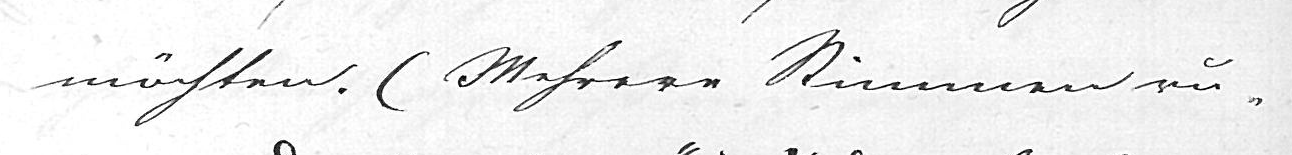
möchte. (Mehrere Stimmen ru-
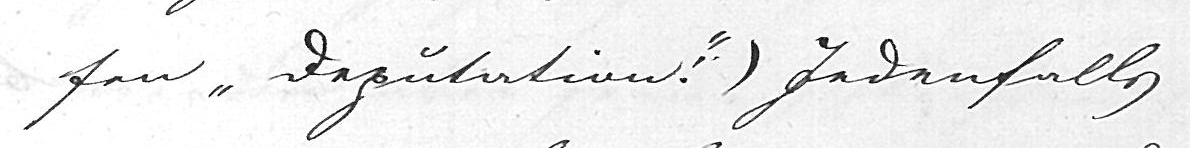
fen "Deputation!") Jedenfalls
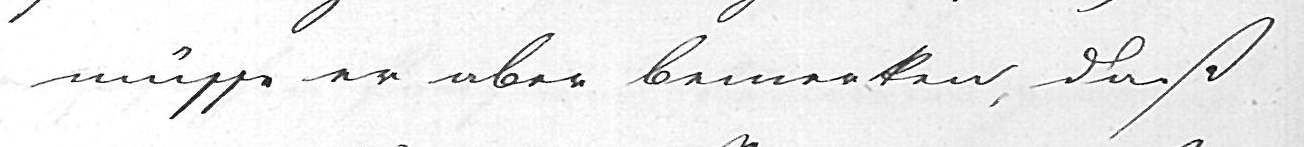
müsse er aber bemerken, daß
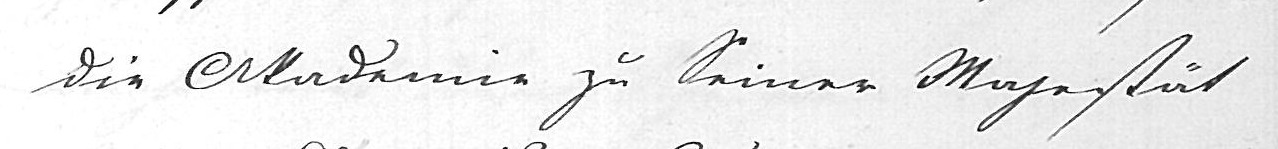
die Akademie zu Seiner Majestät
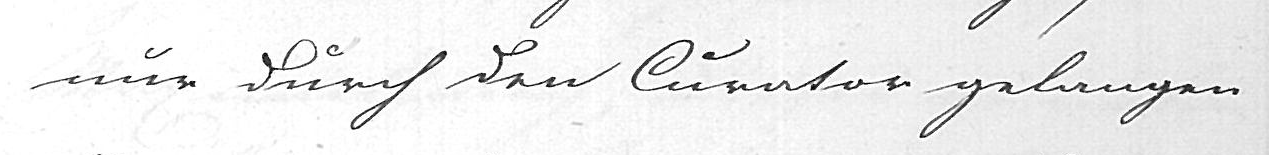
nur durch den Curator gelangen
